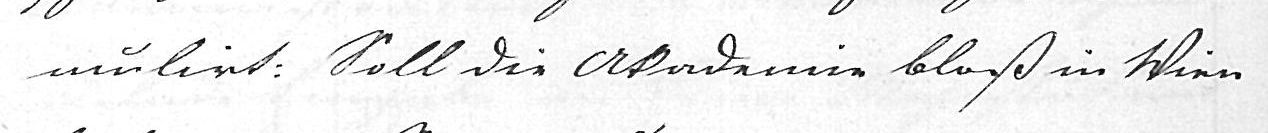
mulirt: Soll die Akademie bloß in Wien
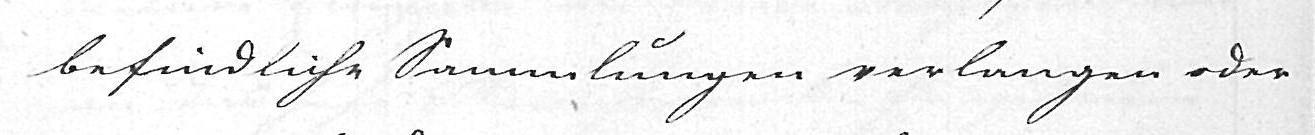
befindliche Sammlungen verlangen oder
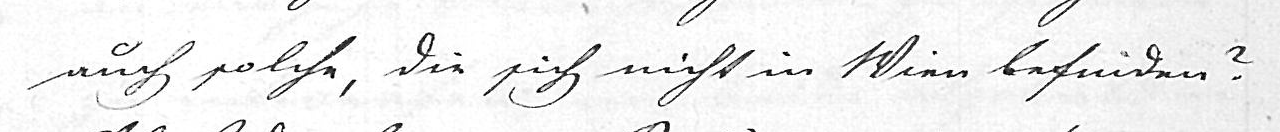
auch solche, die sich nicht in Wien befinden?
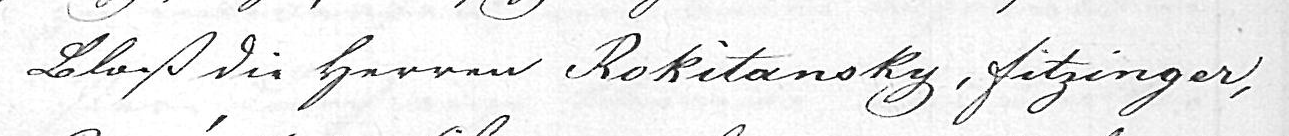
Bloß die Herren Rokitansky, Fitzinger,
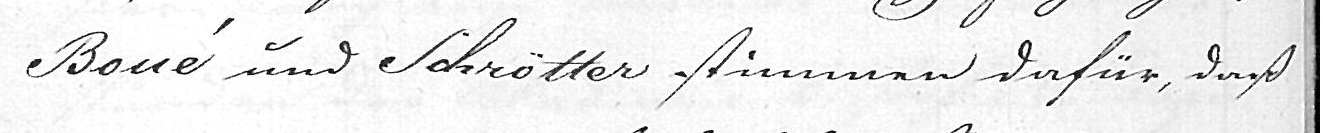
Boué und Schrötter stimmen dafür, daß
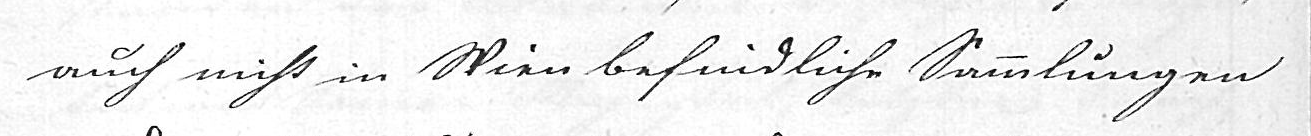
auch nicht in Wien befindlichen Sammlungen
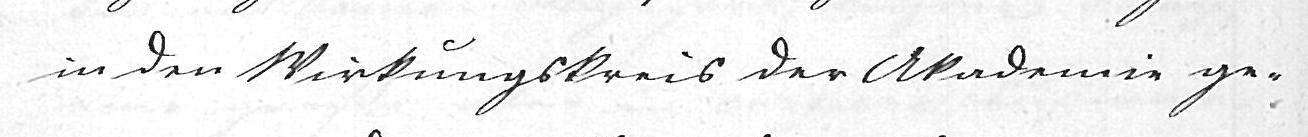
in den Wirkungskreis der Akademie ge-
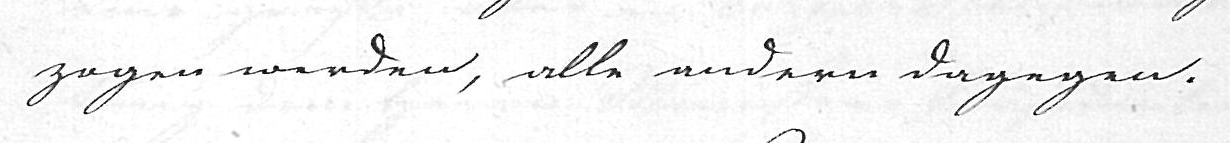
zogen werden, alle andern dagegen.
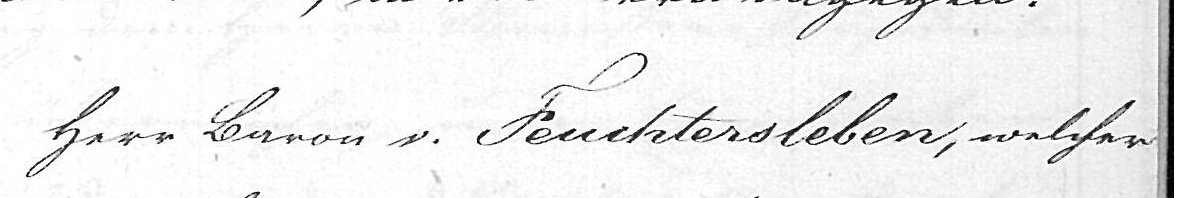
Herr Baron v. Feuchtersleben, welcher
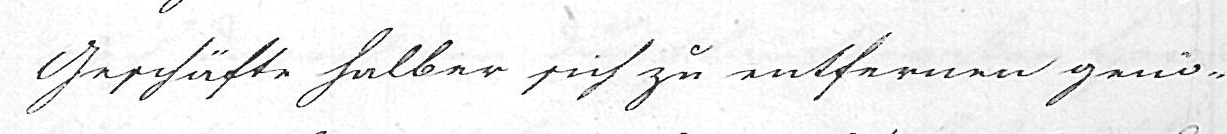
Geschäfte halber sich zu entfernen genö-
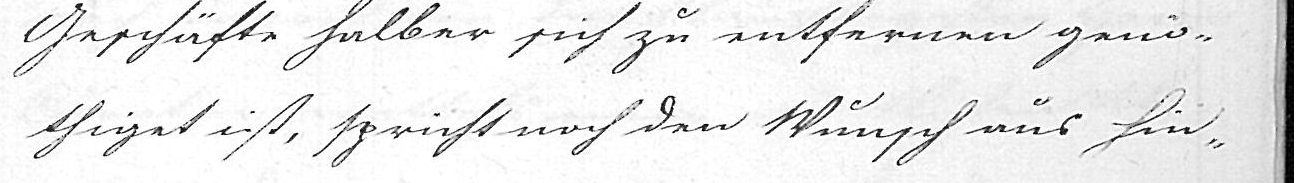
thiget ist, spricht noch den Wunsch aus hin-
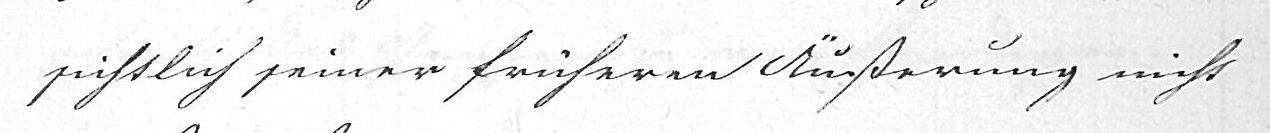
sichtlich seiner früheren Äußerung nicht
